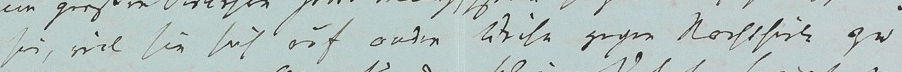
sei, weil sie sich auf andre Weise gegen Nachtheile zu
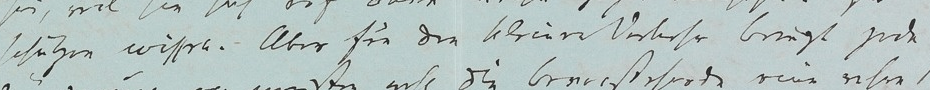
schützen wissen. – Aber für den kleinen Verkehr bringt jede
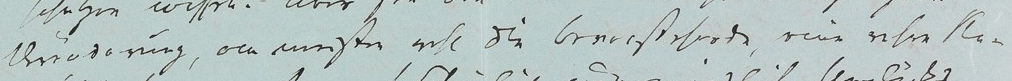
Veränderung, am meisten wohl die bevorstehende, eine wahre Re-
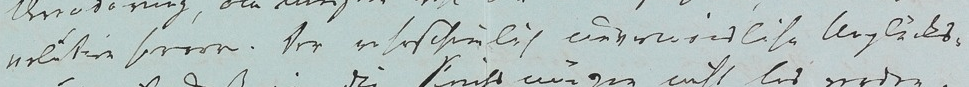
volution hervor. Der wahrscheinlich unvermeidliche Unglücks-
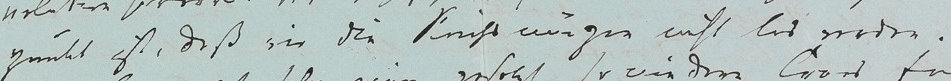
punkt ist, daß wir die Reichsmünzen nicht los werden.
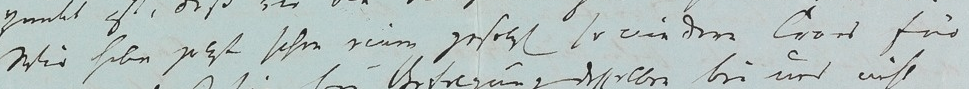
Wir haben jetzt schon einen gesetzlich so niedern Cours für
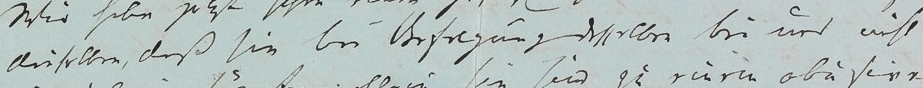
dieselben, daß sie bei Befolgung desselben bei uns nicht
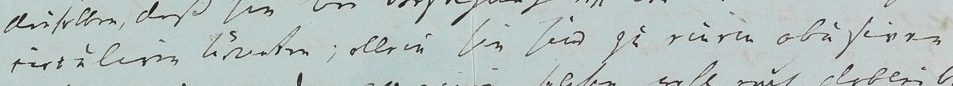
circuliren könnten; allein sie sind zu einem abusiven
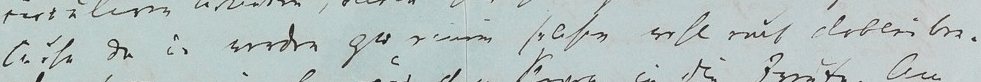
Curse da u. werden zu einem solchen wohl auch dableiben.
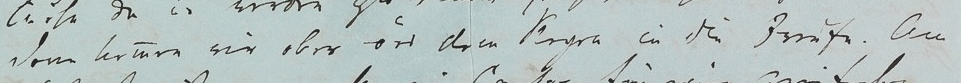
Dann kommen wir aber aus dem Regen in die Traufe. Am
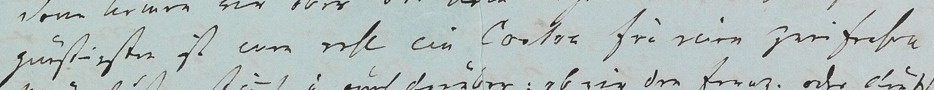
günstigsten ist man wohl im Canton für einen zweifachen
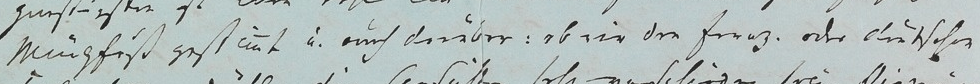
Münzfuß gestimmt u. auch darüber: ob wir den franz. oder deutschen
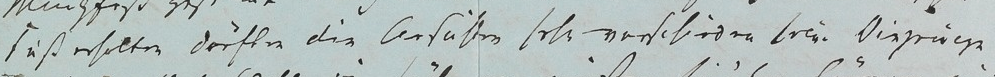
Fuß erhalten dürften die Ansichten sehr verschieden sein. Diejenige
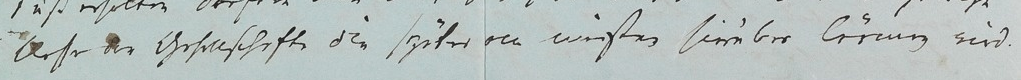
Classe der Gesellschaft, die später am meisten hierüber lärmen wird
